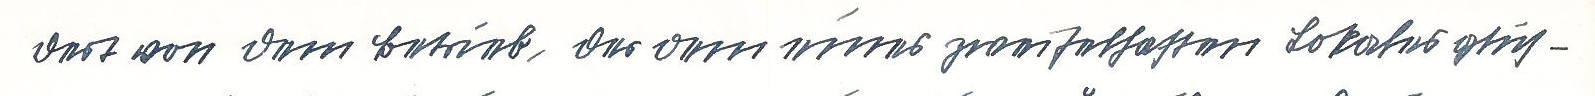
dert von dem Betrieb, der dem eines zweifelhaften Lokales glich –
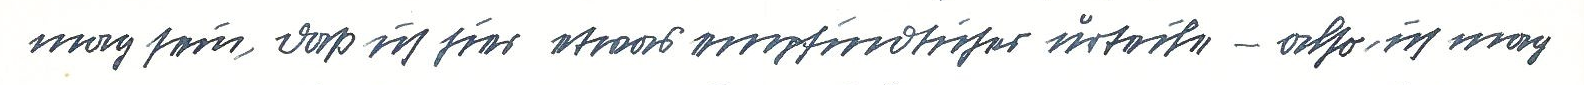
mag sein, daß ich hier etwas empfindlicher urteile – also, ich mag
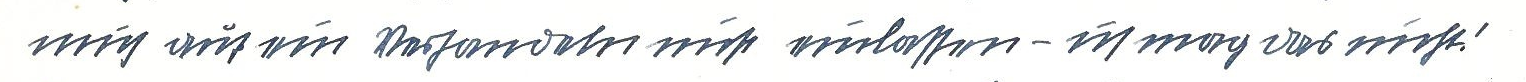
mich auf ein Verhandeln nicht einlassen – ich mag das nicht!
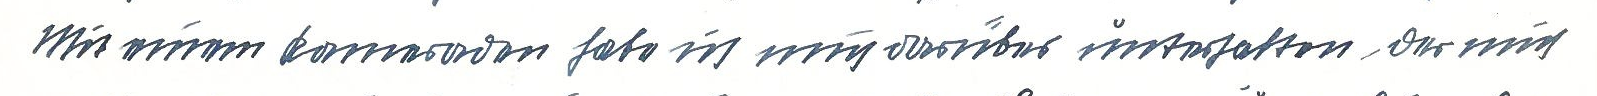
Mit einem Kameraden habe ich mich darüber unterhalten, der mich
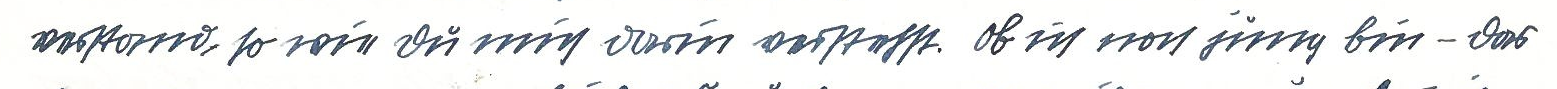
verstand, so wie Du mich darin verstehst. Ob ich noch jung bin – das
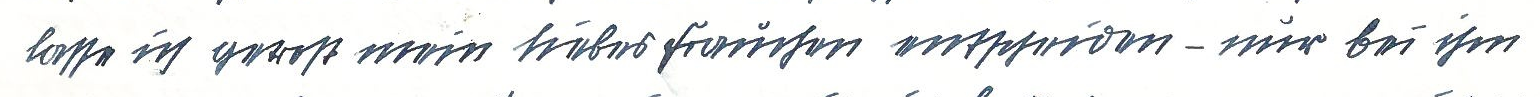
lasse ich getrost mein liebes Frauchen entscheiden – nur bei ihm
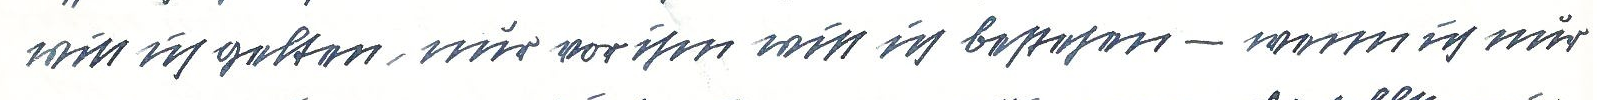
will ich gelten, nur vor ihm will ich bestehen – wenn ich nur
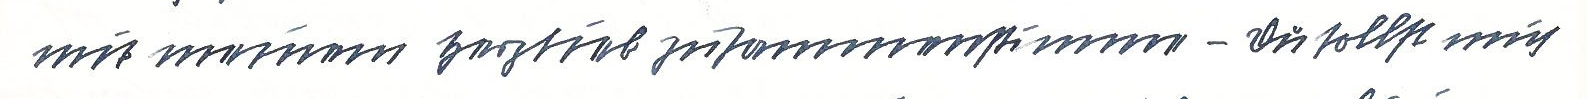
mit meinem Herzlieb zusammenstimme – Du sollst mich
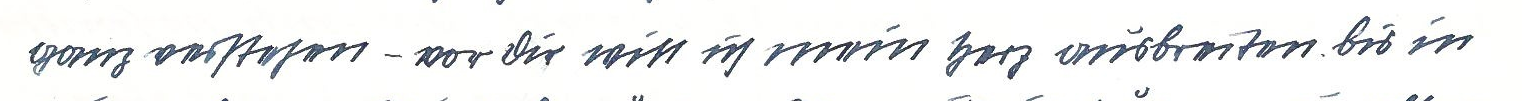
ganz verstehen – vor Dir will ich mein Herz ausbreiten bis in
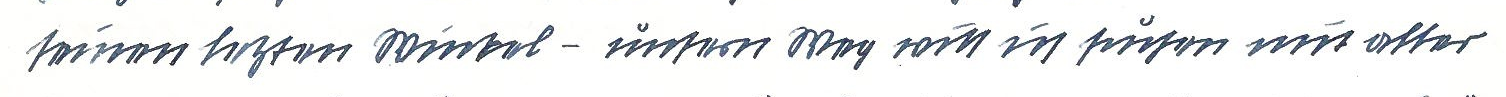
seinen letzten Winkel – unsern Weg will ich suchen mit aller
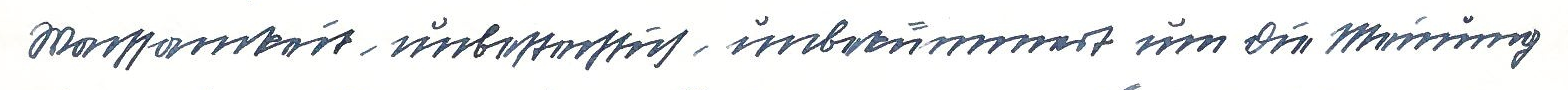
Wachsamkeit, unbestechlich, unbekümmert um die Meinung
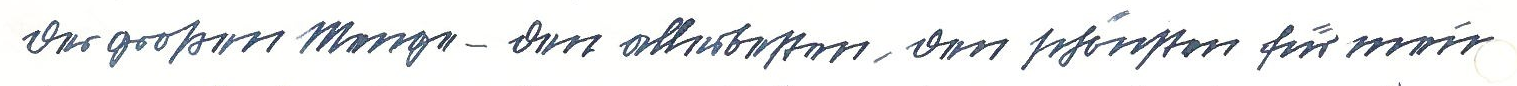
der großen Menge – den allerbesten, den schönsten für mein
